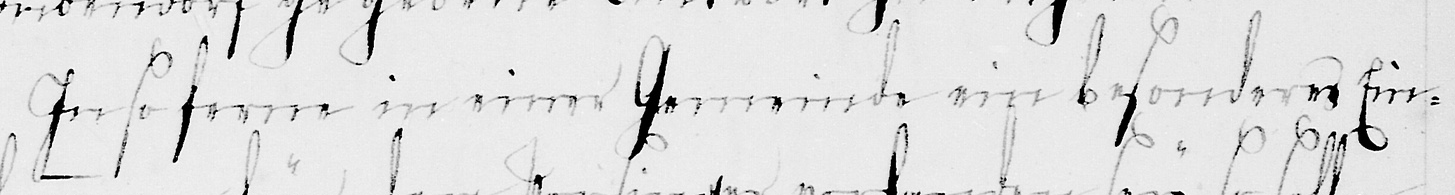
Insoferne in einer Gemeinde ein besonderes Ein¬
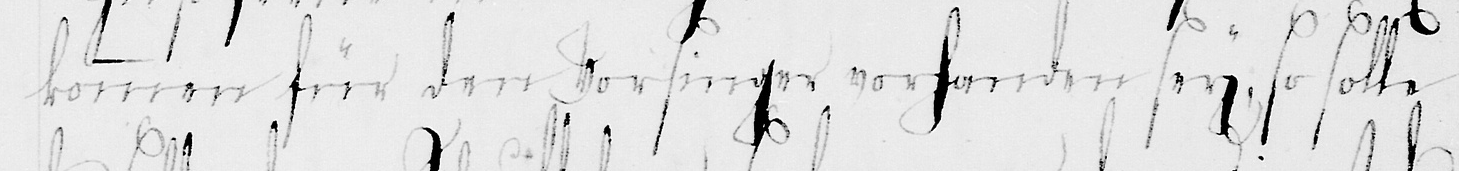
kommen für den Vorsinger vorhanden sey, so solle
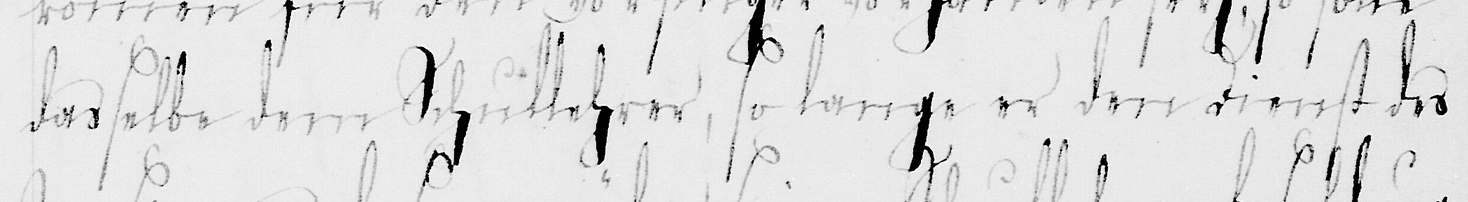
dasselbe dem Schullehrer, so lange er den Dienst des
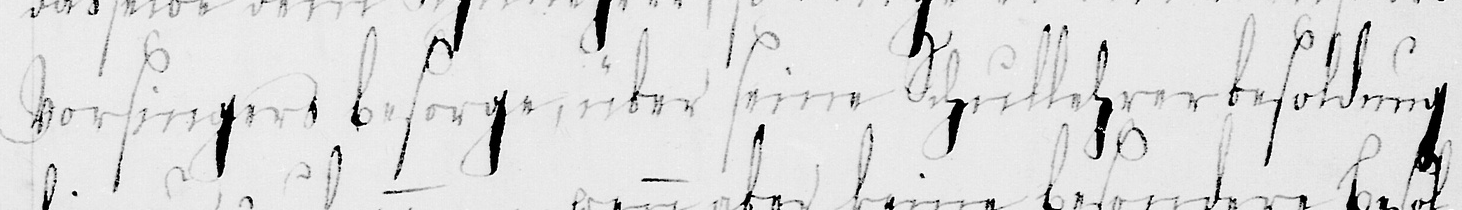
Vorsingers besorge, über seine Schullehrerbesoldung
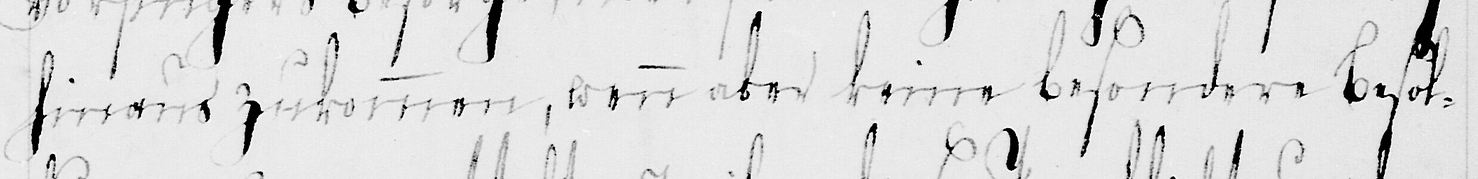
hinaus zukommen, wenn aber keine besondere Besol¬
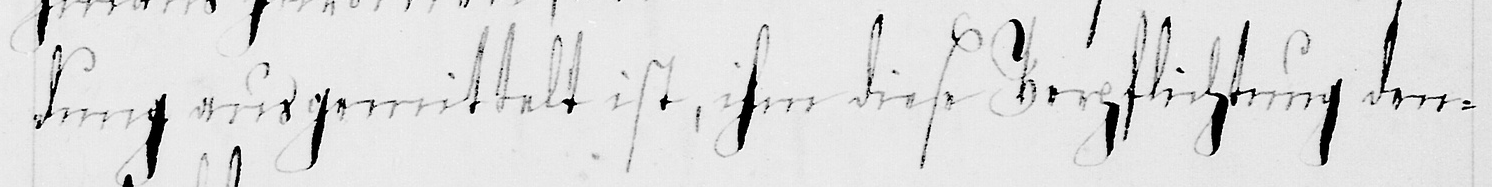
dung ausgemittelt ist, ihm diese Verpflichtung den¬
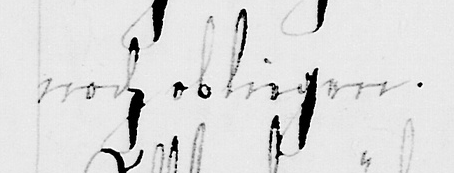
noch obliegen.
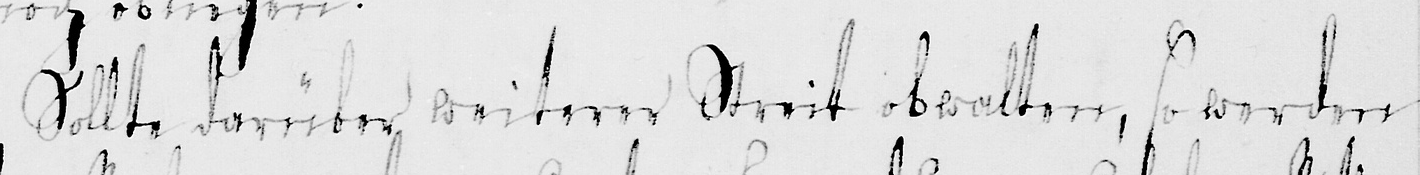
Sollte darüber weiterer Streit obwalten, so werden
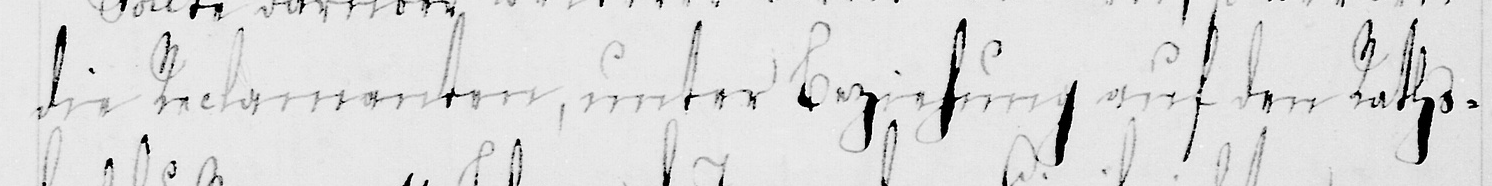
die Reclamanten, unter Beziehung auf den Raths¬
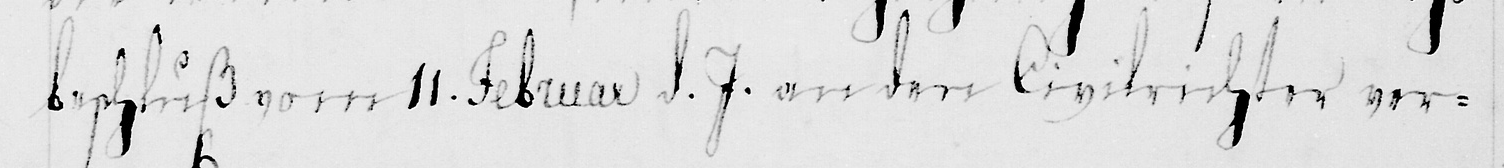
beschluß vom 11. Februar d. J. an den Civilrichter ver¬
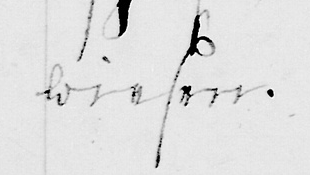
wiesen.
